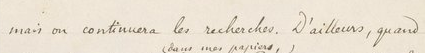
mais on continuera les recherches. D'ailleurs, quand
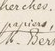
cette
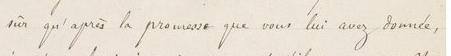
sûr qu'après la promesse que vous lui avez donnée,
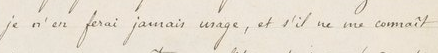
je n'en ferai jamais usage, et s'il ne me connaît
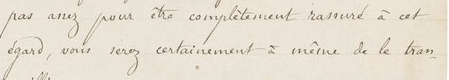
égard, vous serez certainement à même de le tran-
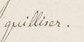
quilliser.
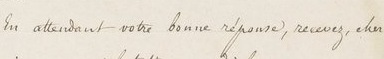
En attendant votre bonne réponse, recevez, cher
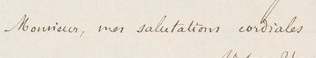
Monsieur, mes salutations cordiales
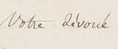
Votre dévoué
